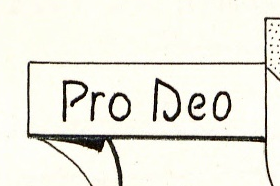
Pro Deo
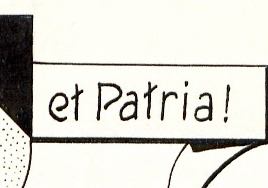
et Patria
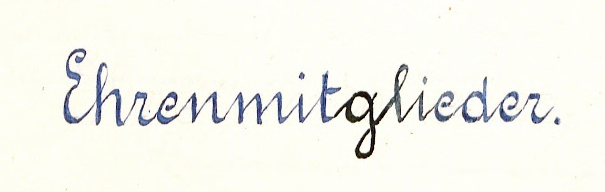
Ehrenmitglieder.
